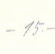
-15.-
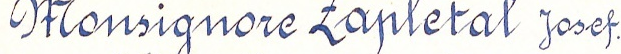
Monsignore Zapletal Josef.
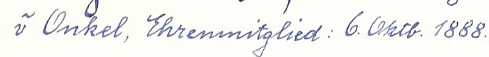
v/o Onkel, Ehrenmitglied: 6. Oktob. 1888.
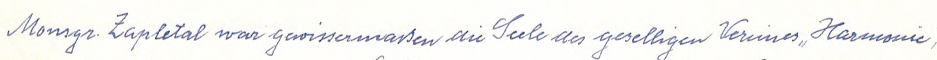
Monsgr. Zapletal war gewissermaßen die Seele des geselligen Vereins "Harmonie",
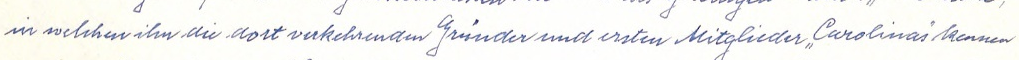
in welchen ihn die dort verkehrenden Gründer und ersten Mitglieder "Carolinas" kennen
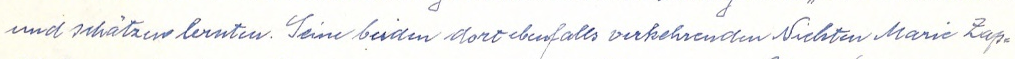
und schätzen lernten. Seine beiden dort ebenfalls verkehrenden Nichten Marie Zap-
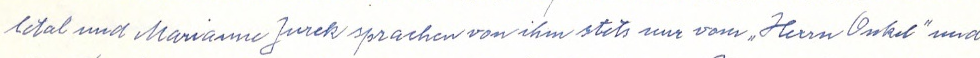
letal und Marianne Jurek sprachen von ihm stets nur vom "Herrn Onkel" und
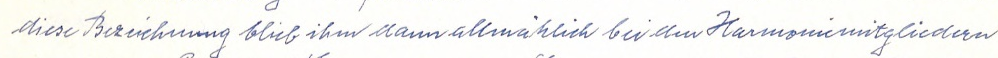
diese Bezeichnung blieb ihm dann allmählich bei den Harmoniemitgliedern
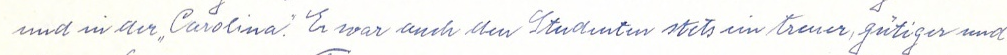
und in der "Carolina". Er war auch den Studenten stets ein treuer, gütiger und
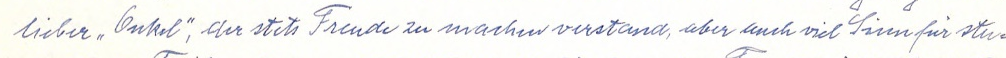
lieber "Onkel", der stets Freude zu machen verstand, aber auch viel Sinn für stu-
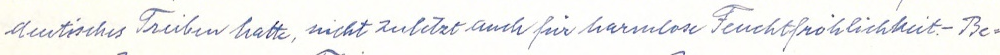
dentisches Treiben hatte, nicht zuletzt auch für harmlose Feuchtfröhlichkeit. - Be-
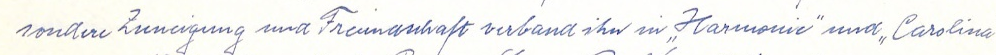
sondere Zuneigung und Freundschaft verband ihn in "Harmonie" und "Carolina"
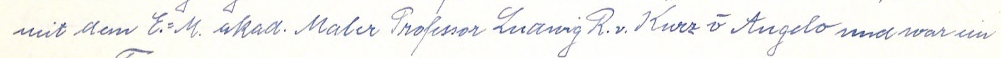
mit dem E.-M. akad. Maler Professor Luanig R. v. Kurz v/o Angelo und war ein
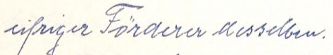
eifriger Förerer desselben.
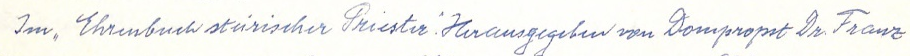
Im "Ehrenbuch steirischer Priester". Herausgegeben von Dompropst Dr. Franz
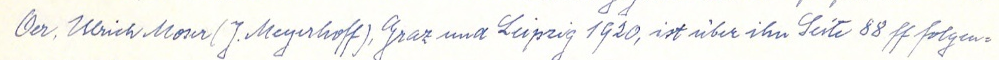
Oer, Ulrich Moser (J. Meyerhoff), Graz und Leipzig 1920, ist über ihn Seite 88 ff folgen-
